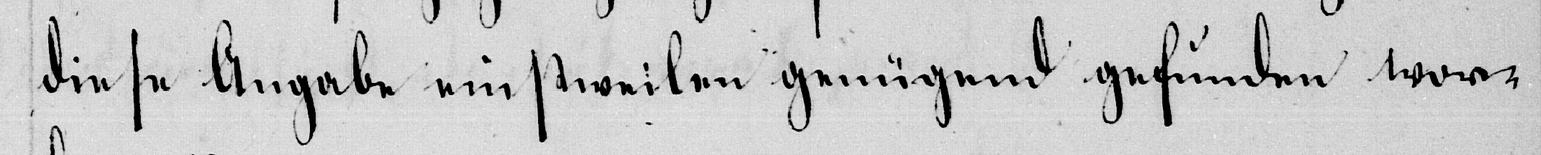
diese Angabe einstweilen genügend gefunden wor¬
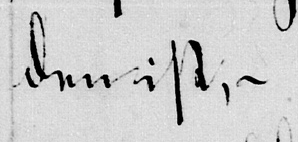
den ist, –
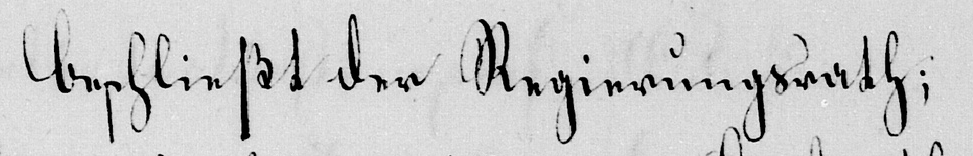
beschließt der Regierungsrath;
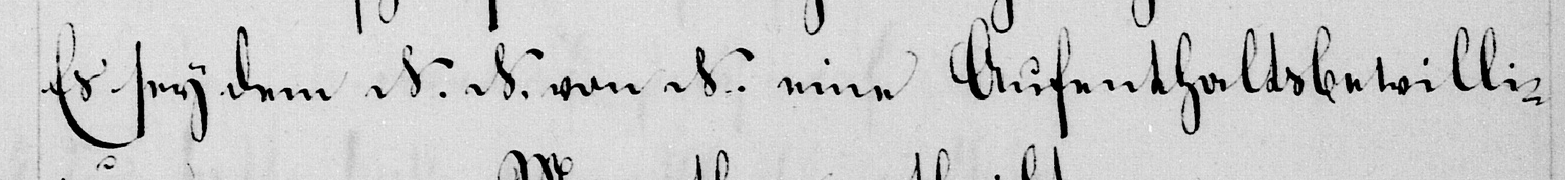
Es sey dem N. N. von N. eine Aufenthaltsbewilli¬
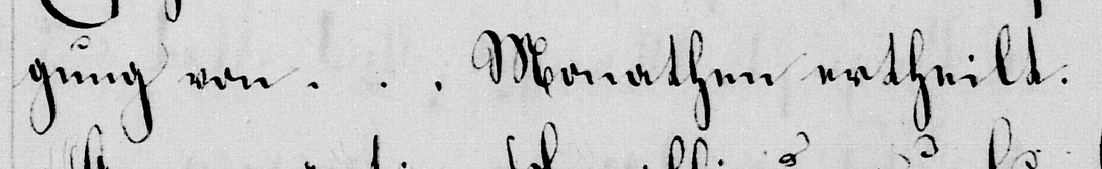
gung von ... Monathen ertheilt.
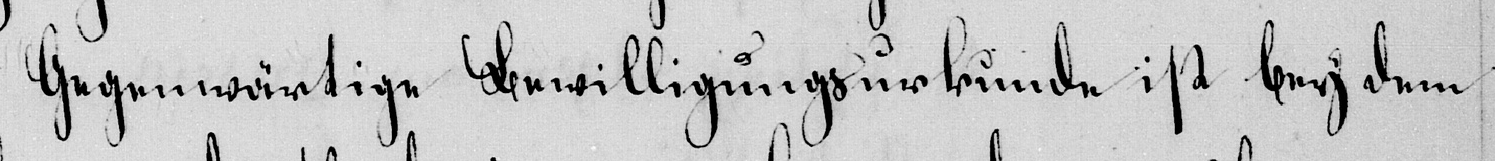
Gegenwärtige Bewilligungsurkunde ist bey dem
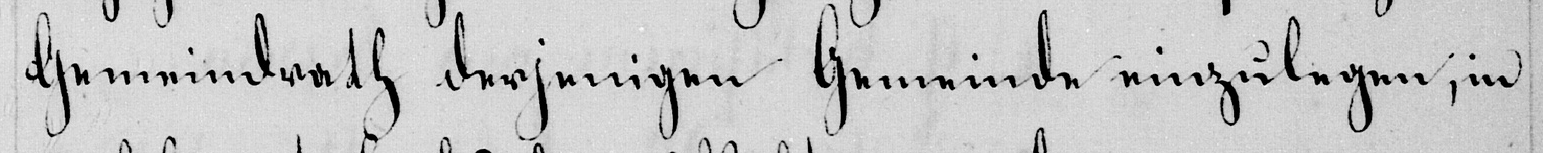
Gemeindrath derjenigen Gemeinde einzulegen, in
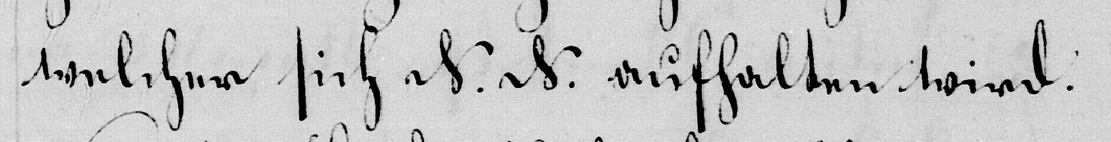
welcher sich N. N. aufhalten wird.
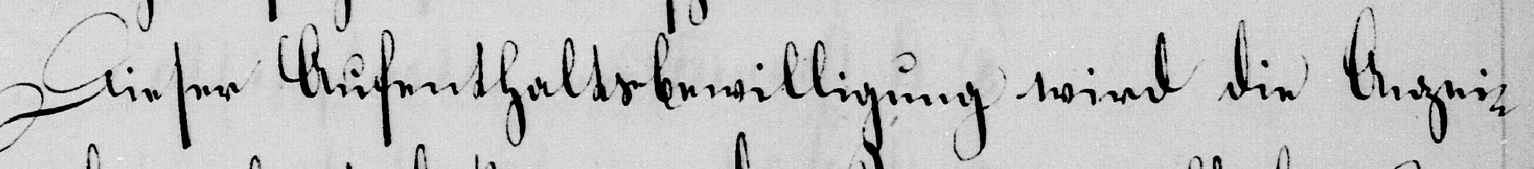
Dieser Aufenthaltsbewilligung wird die Anzei¬
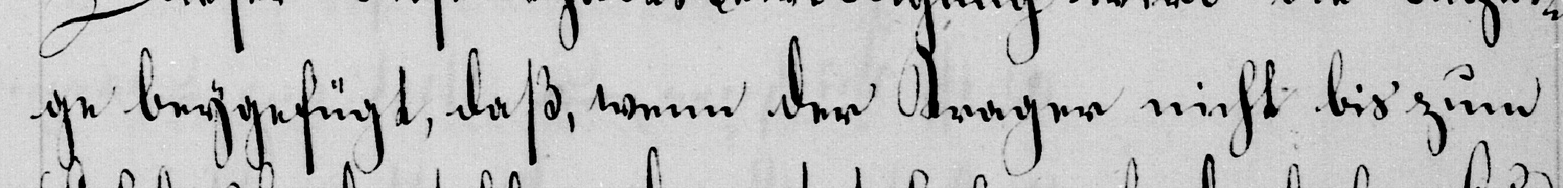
ge beygefügt, daß, wenn der Trager nicht bis zum
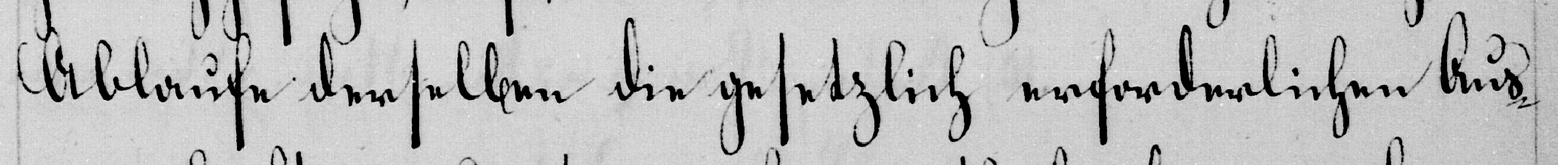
Ablaufe derselben die gesetzlich erforderlichen Aus¬
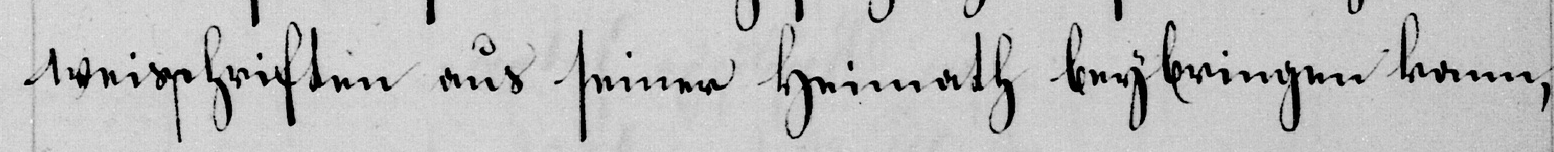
weisschriften aus seiner Heimath beybringen kann,
